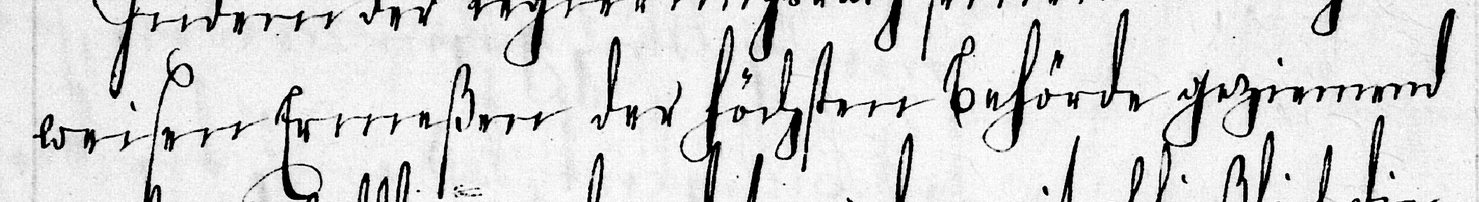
weisen Ermeßen der Höchsten Behörde geziemend
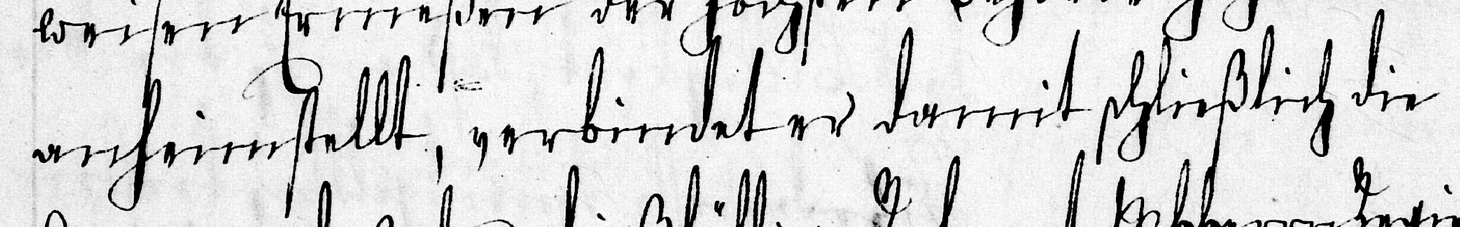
anheimstellt, verbindet er damit schließlich die
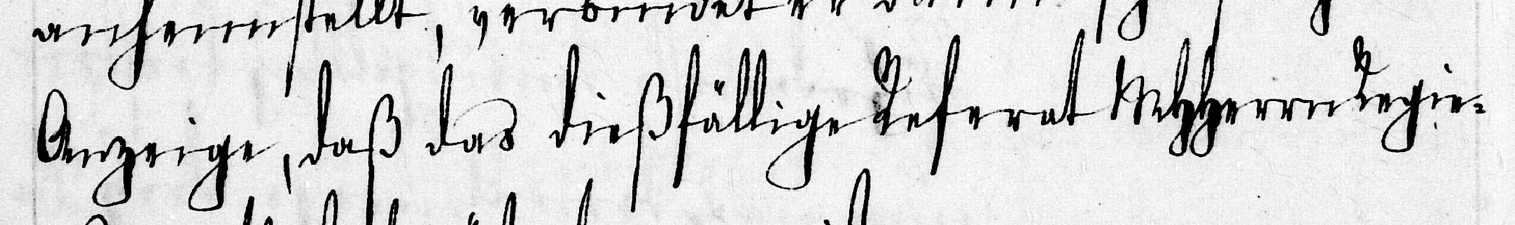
Anzeige, daß das dießfällige Referat MHHerrn Regie¬
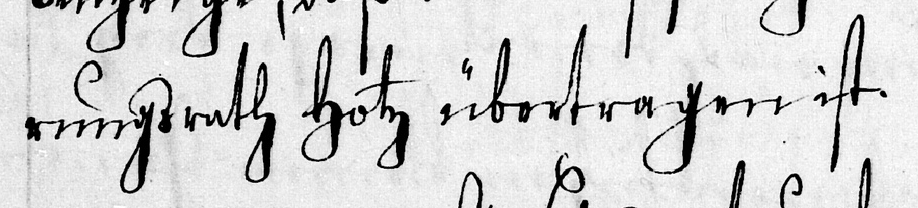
rungsrath Hotz übertragen ist.
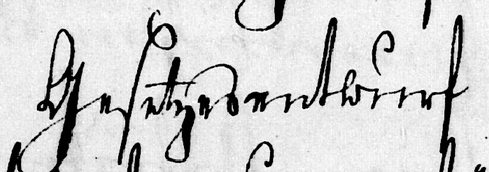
Gesetzesentwurf
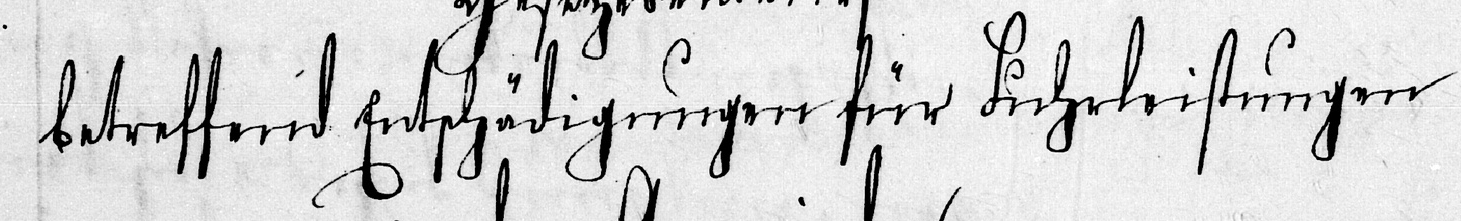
betreffend Entschädigungen für Fuhrleistungen
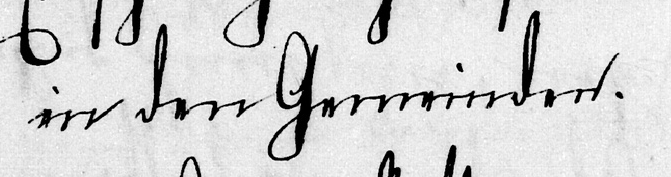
in den Gemeinden.
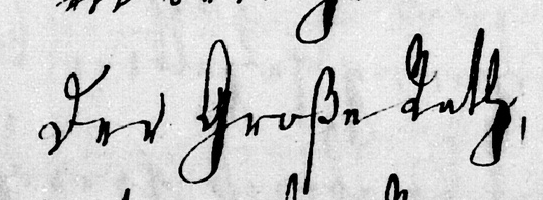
Der Große Rath,
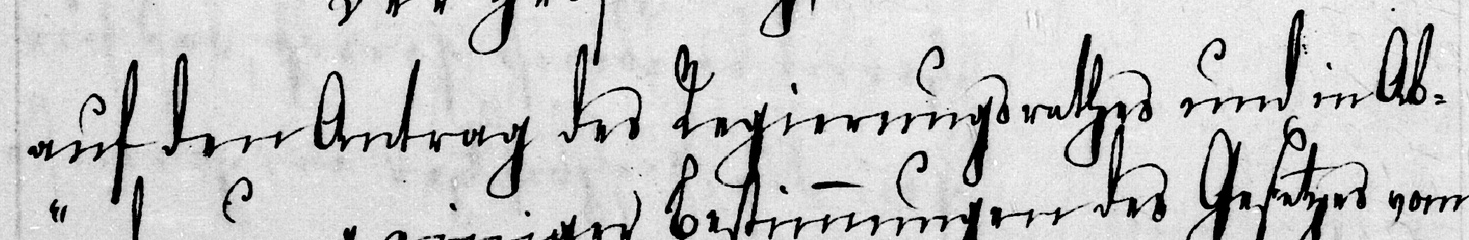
auf den Antrag des Regierungsrathes und in Ab¬
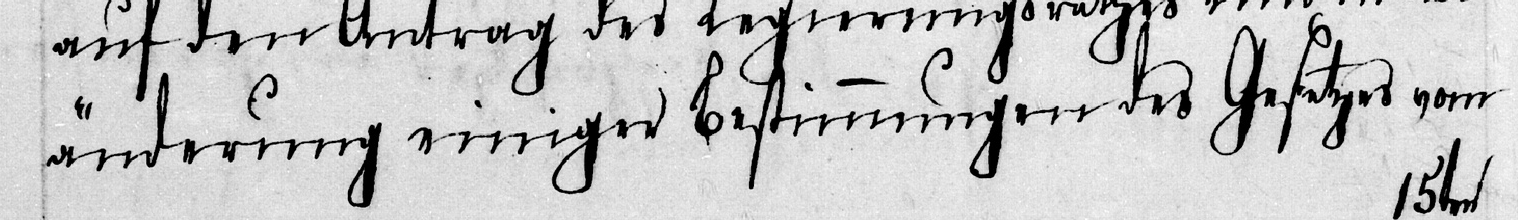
änderung einiger Bestimmungen des Gesetzes vom
